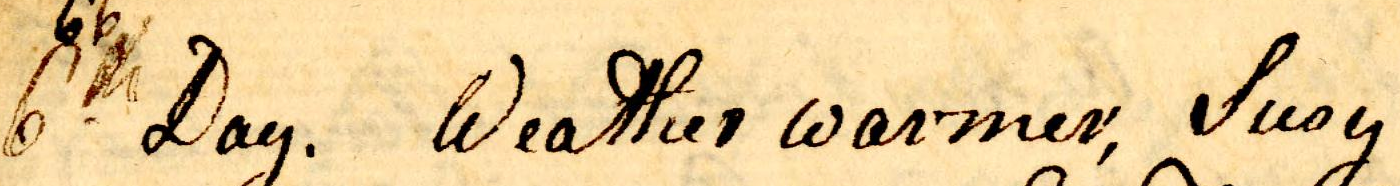6^th Day. Weather warmer, Susy
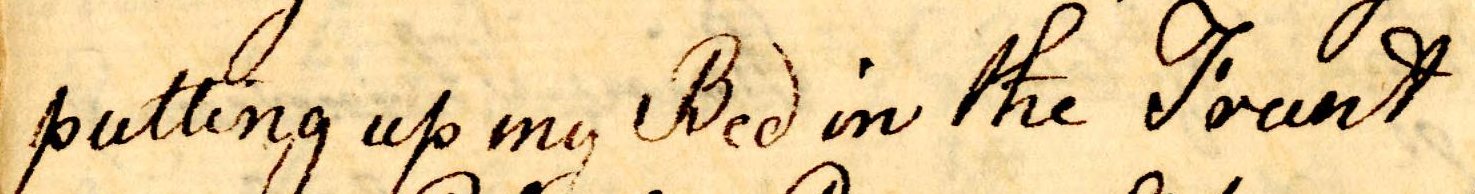putting up my Bed in the Frunt
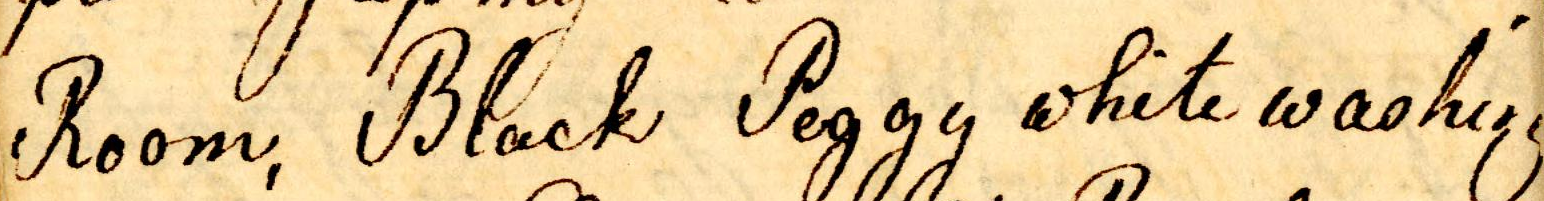Room, Black Peggy white washing
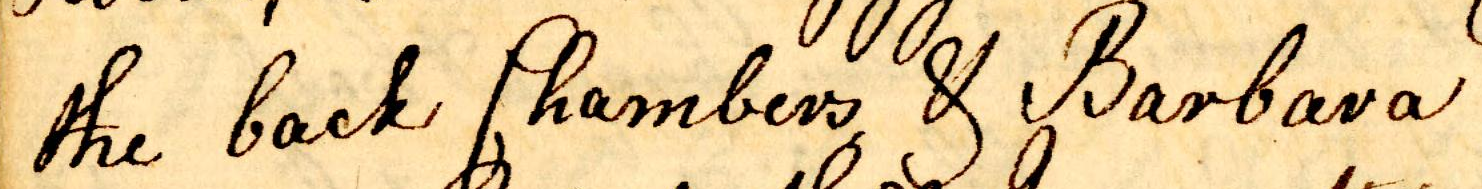the back Chambers & Barbara
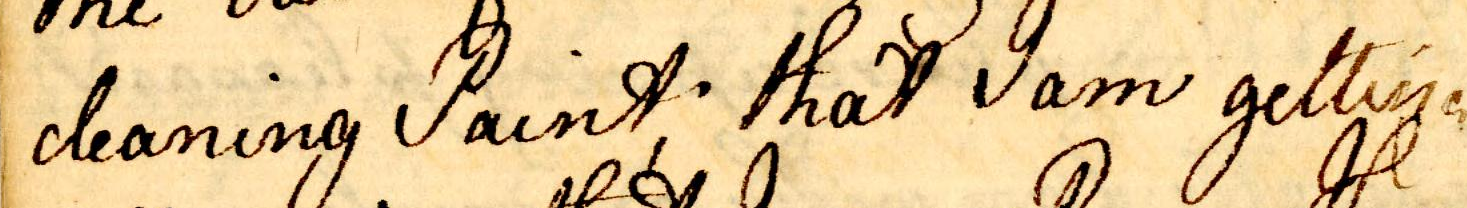cleaning Paint that I am getting
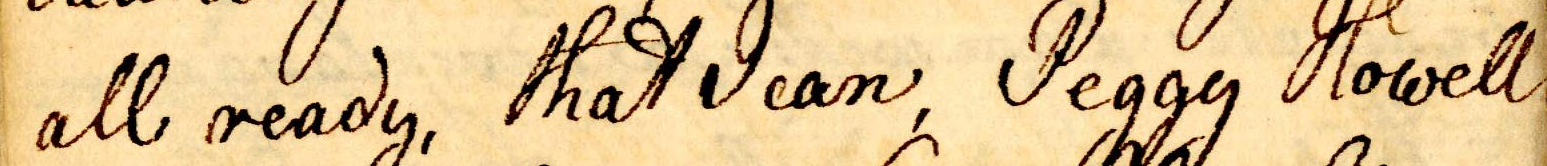all ready, that I can, Peggy Howell
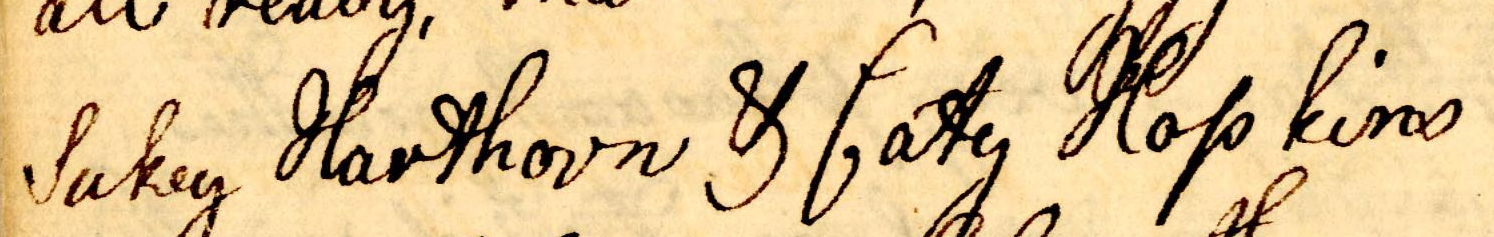Sukey Harthorn & Catty Hopkins
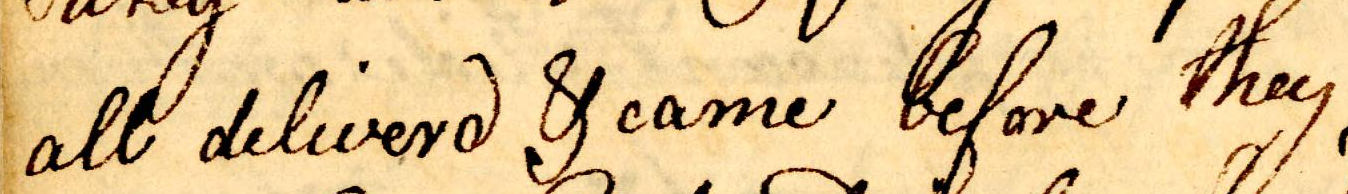all delivered & came before they
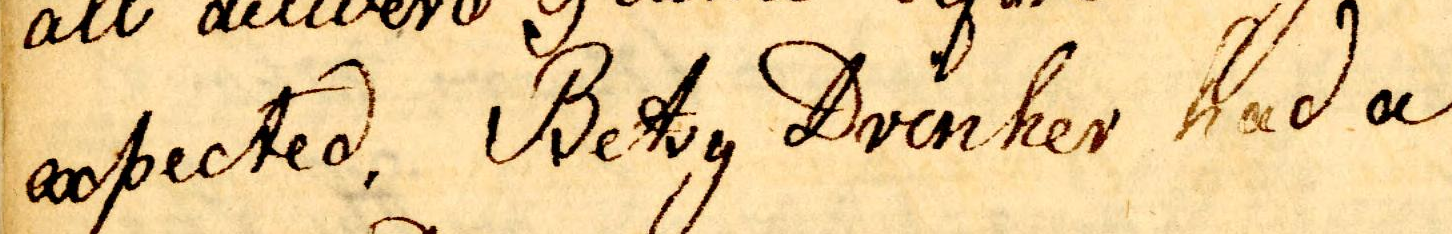expected, Betsy Drinker had a
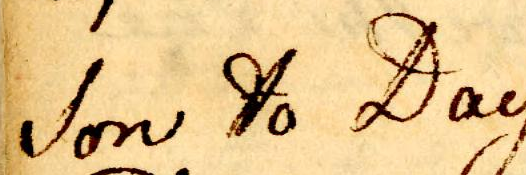Son to Day
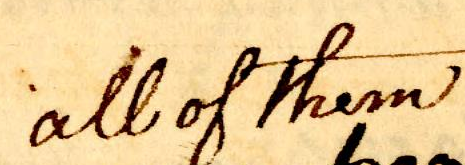all of them
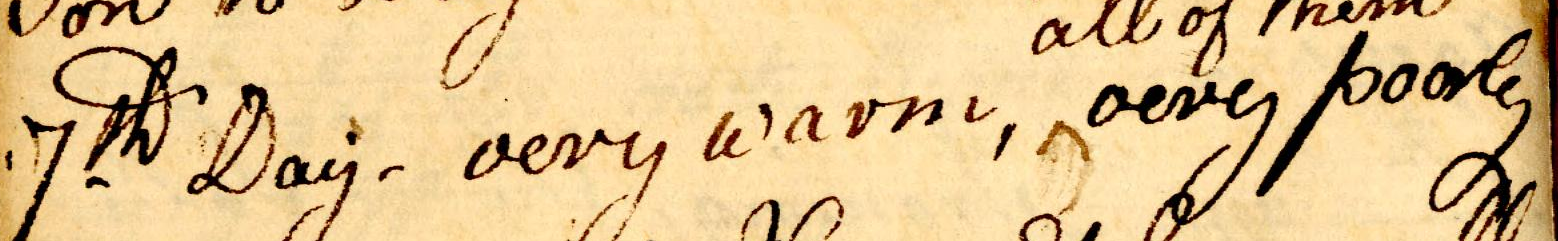7^th Day- very warm, ^ very poorly
